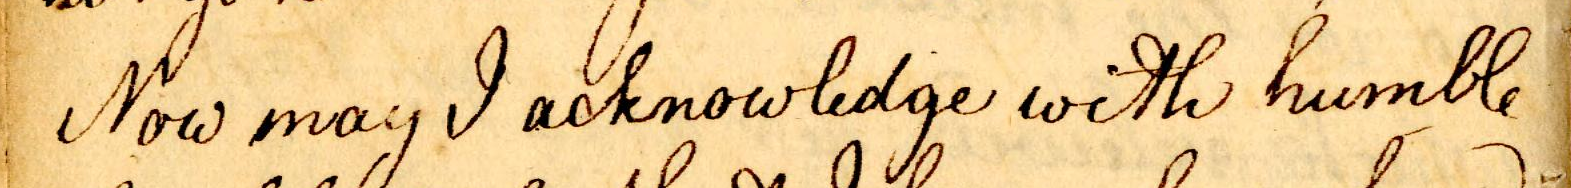Now may I acknowledge with humble
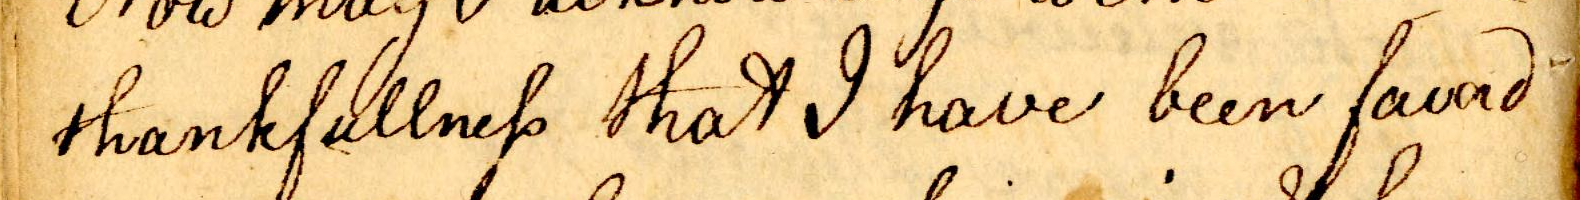thankfullness that I have been favord
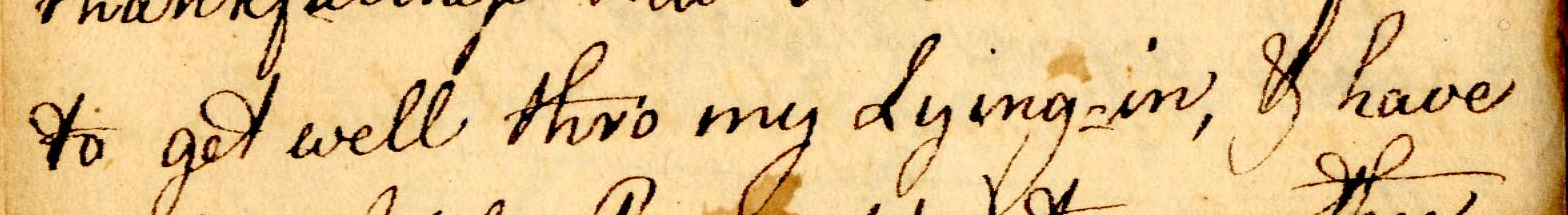to get well thro my Lying in, & have
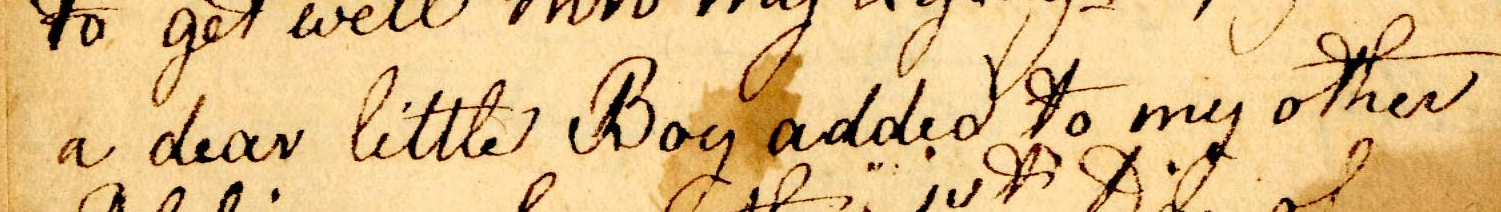a dear little Boy added to my other
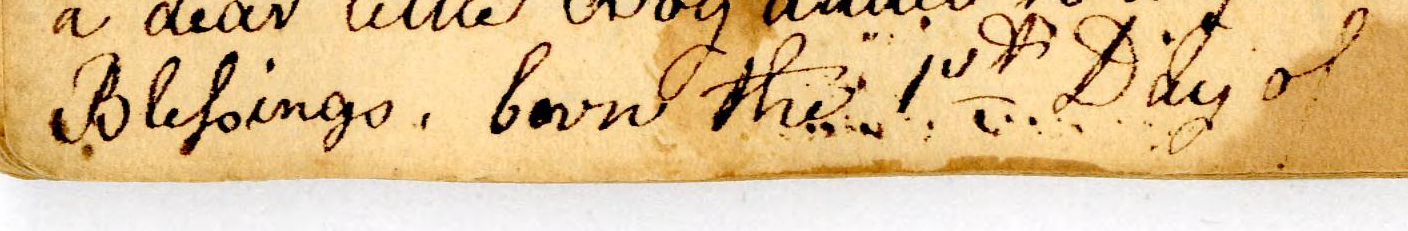Blessings, born the 1^st Day of
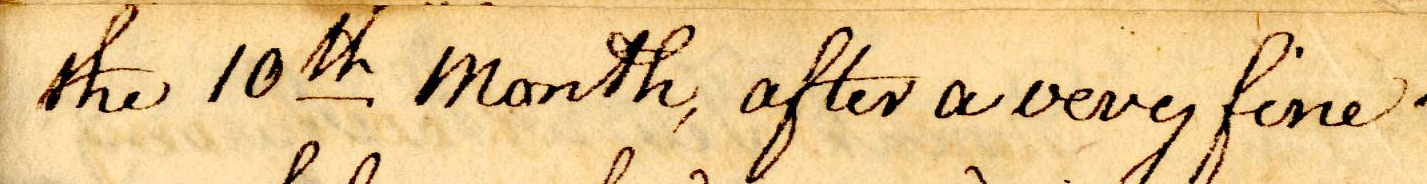the 10^th Month, after a very fine
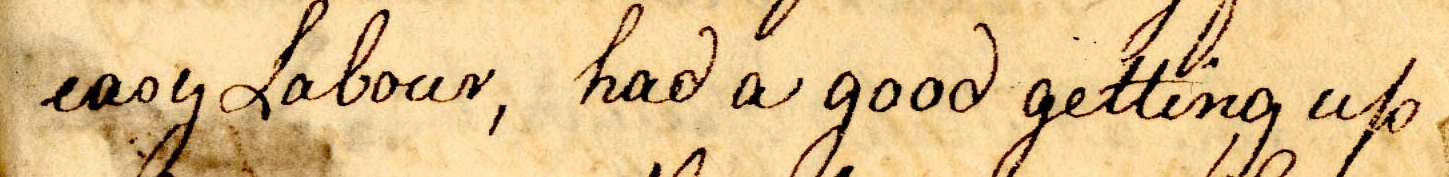easy Labour, had a good getting up
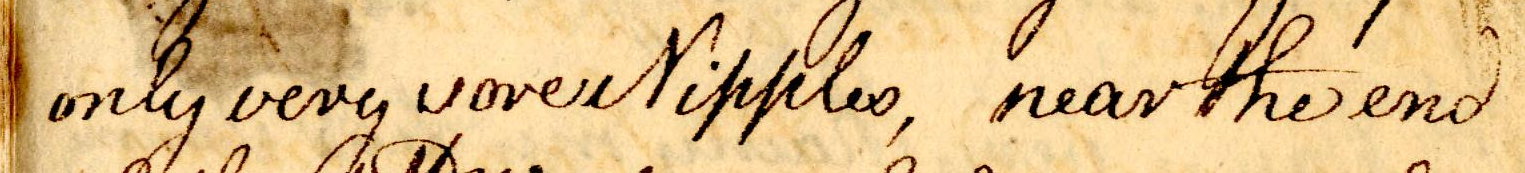only very sore Nipples, near the end
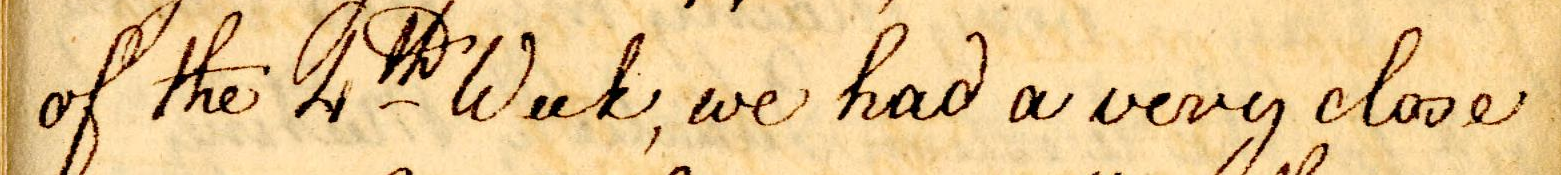of the 4^th Week, we had a very close
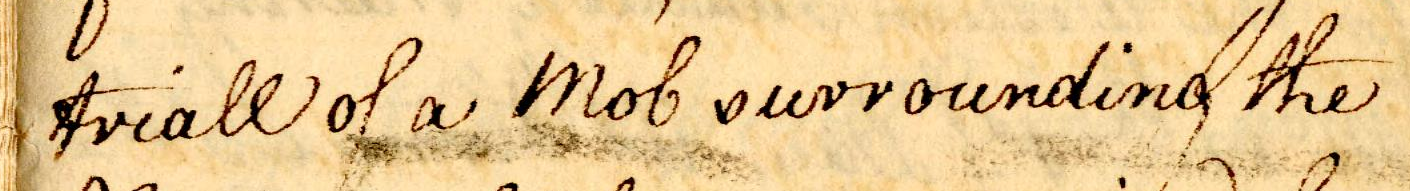triall of a Mob surrounding the
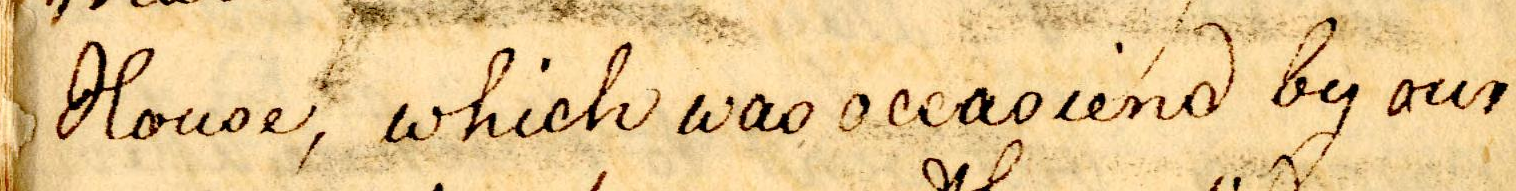House, which was occasioned by our
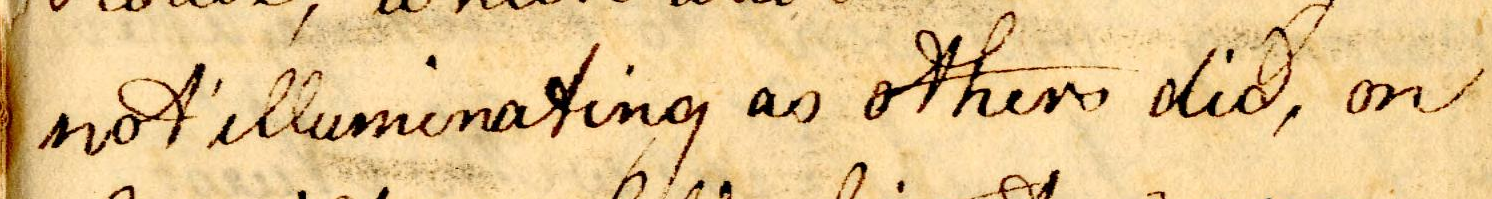not illuminating as others did, on
